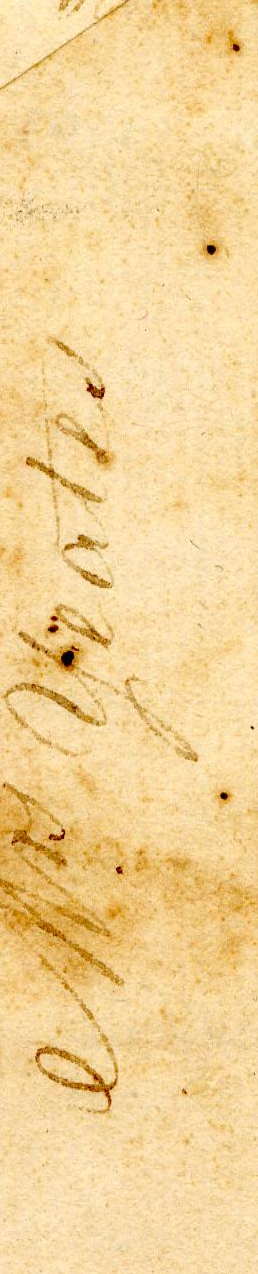M^rs. Yeates
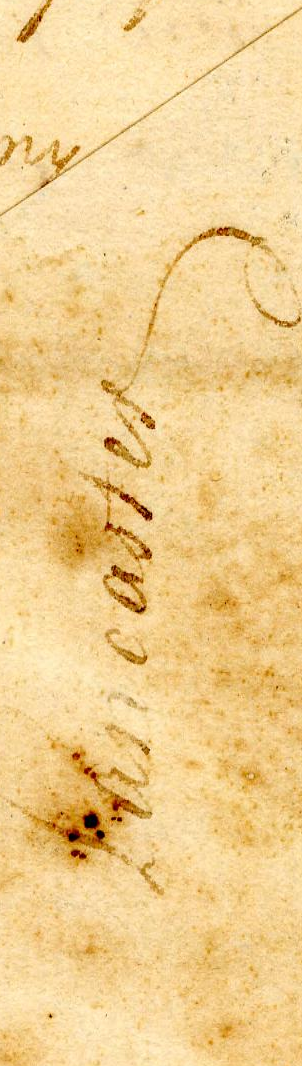Lancaster
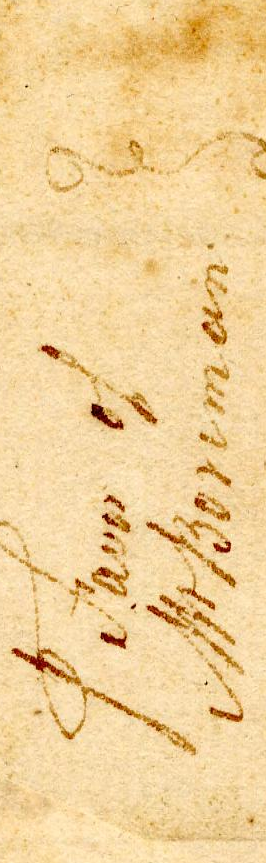Per Favor of
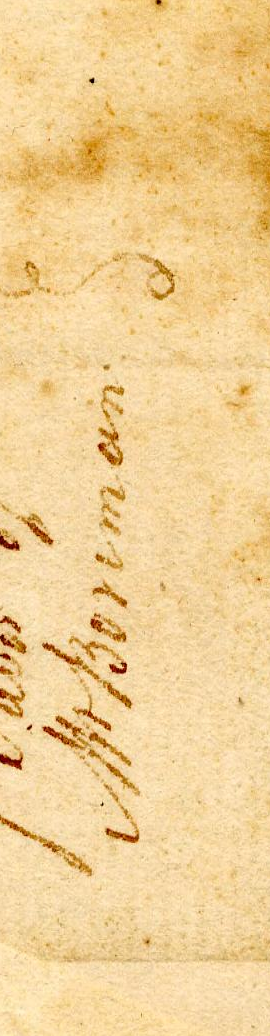M^r Boreman
